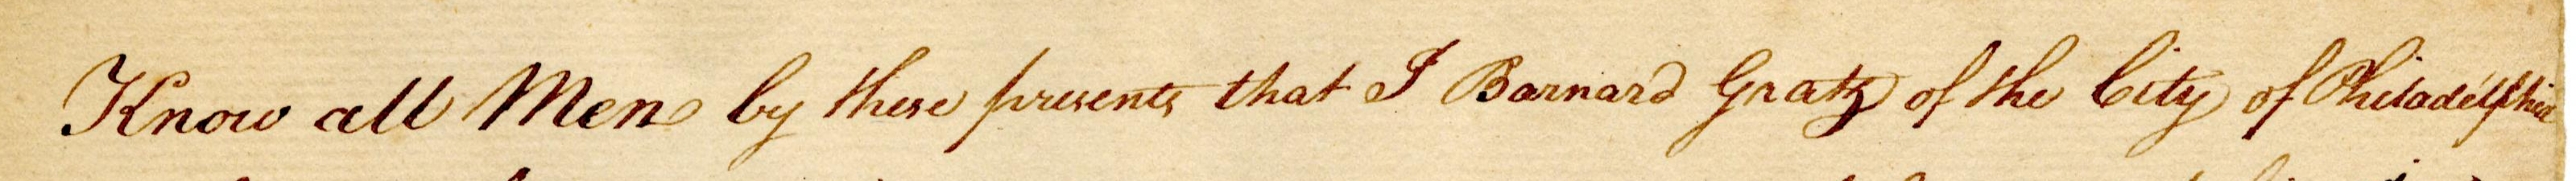Know all Men by these presents that I Barnard Gratz of the City of Philadelphia
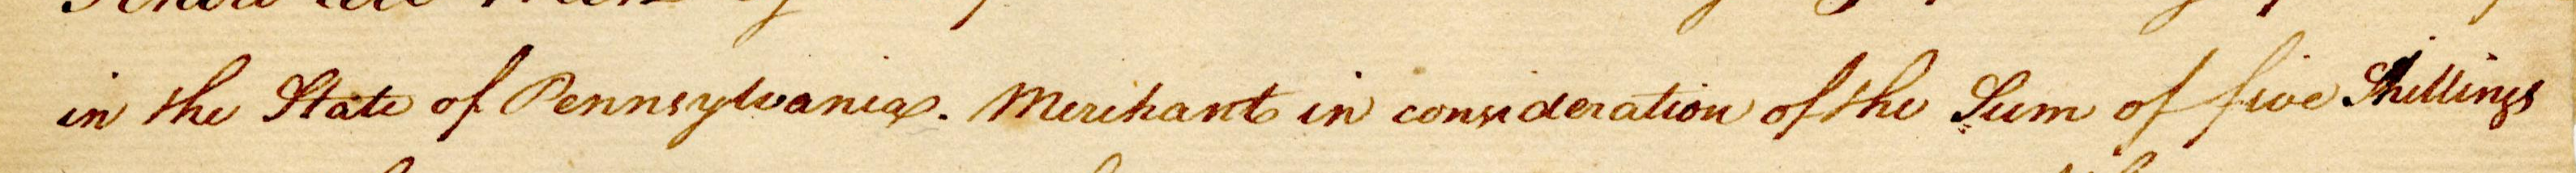in the State of Pennsylvania. Merchant in consideration of the sum of five shillings
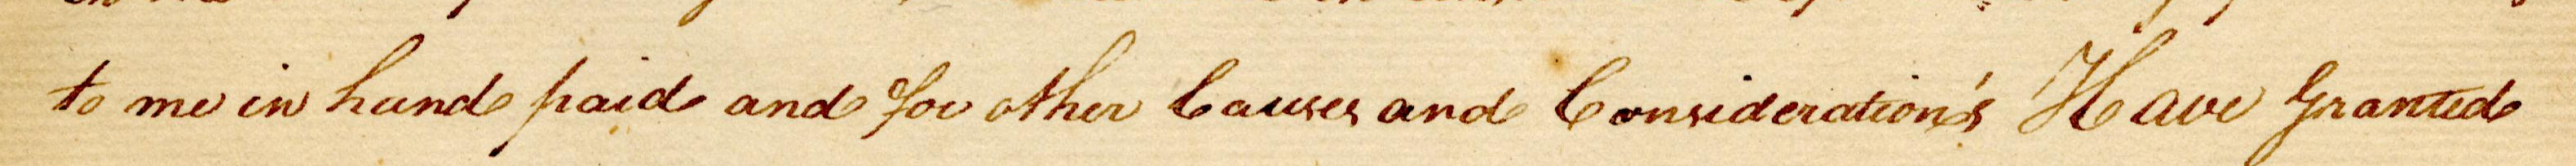to me in Lands paid and for other Causes and Consideration's Have Granted
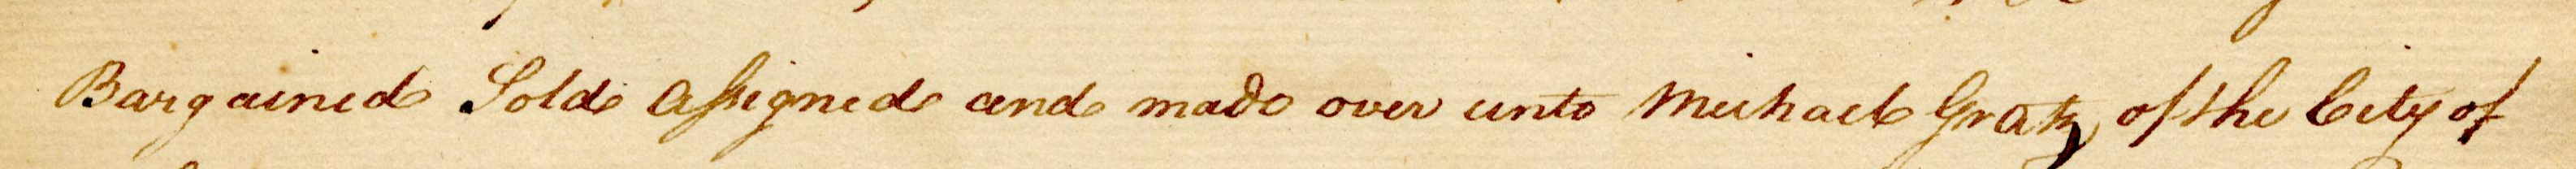Bargained Sold assigned and made over unto Michael Gratz of the City of
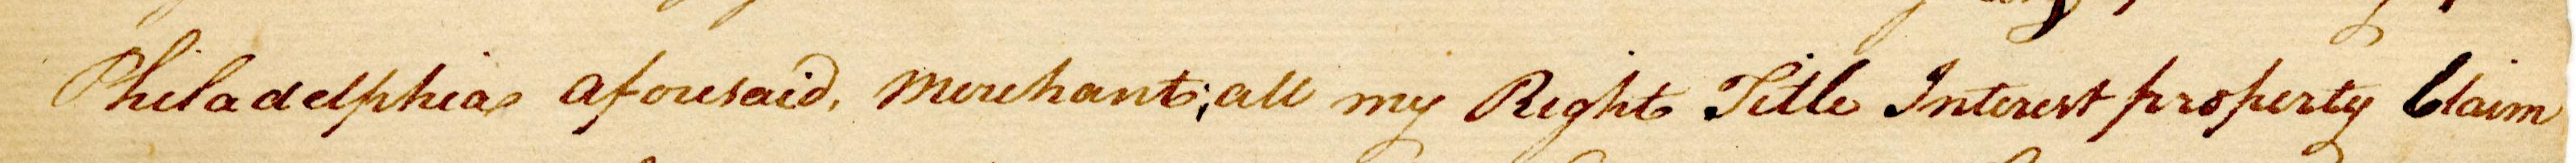Philadelphia aforesaid. merchant; all my Right Title Interest property Claim
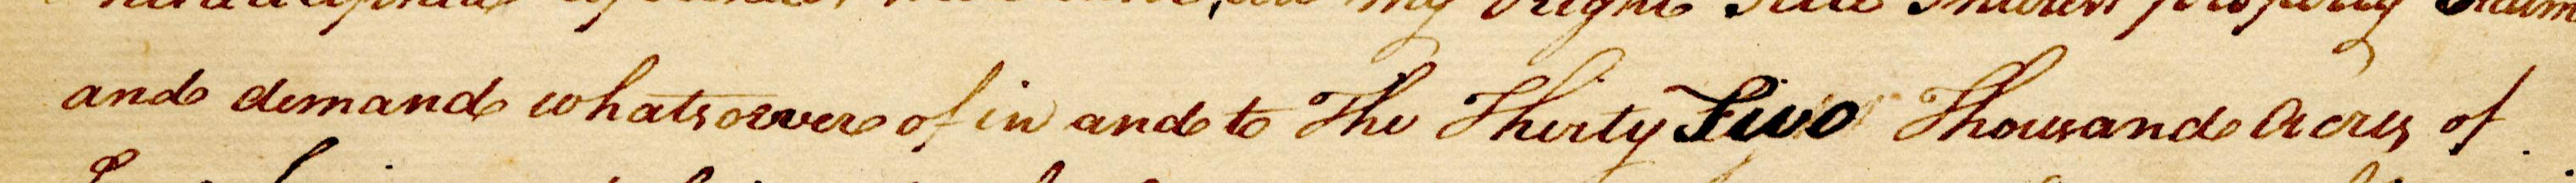and demand whatsoever of in and to The Thirty Two Thousand Acres of
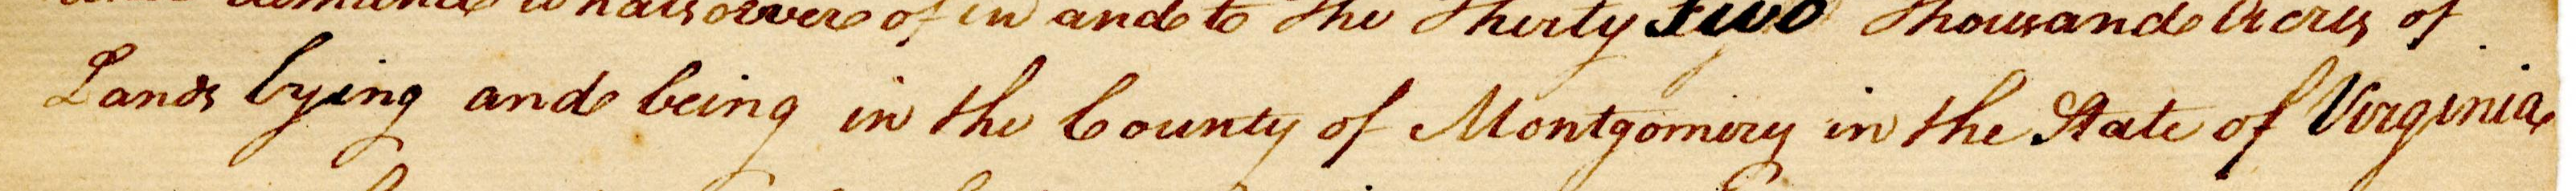Lands lying and being in the County of Montgomery in the state of Virginia
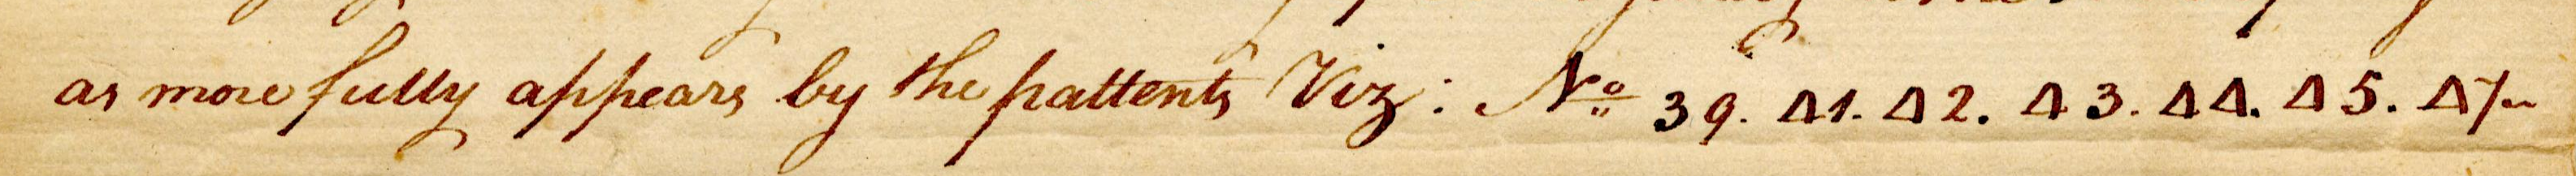as more fully appears by the pattents Viz: N^o. 39. 41. 42. 43. 44. 45. 47-
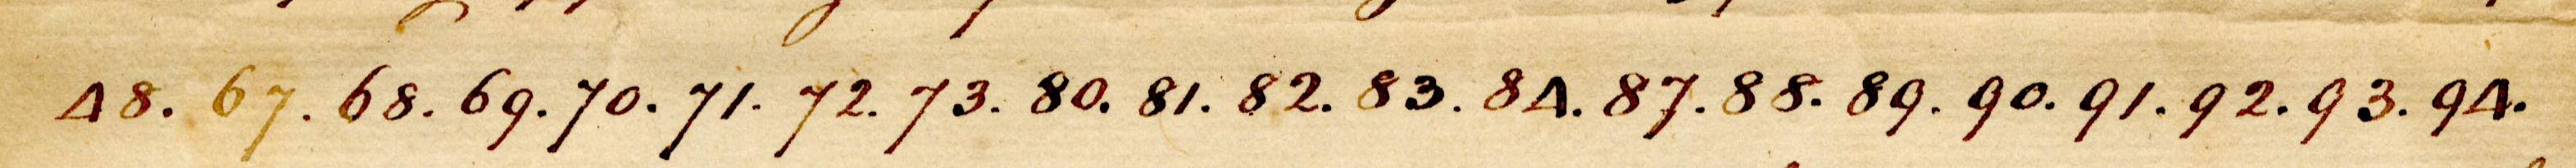48. 67. 68. 69. 70. 71. 72. 73. 80. 81. 82. 83. 84. 87. 88. 89. 90. 91. 92. 93. 94.
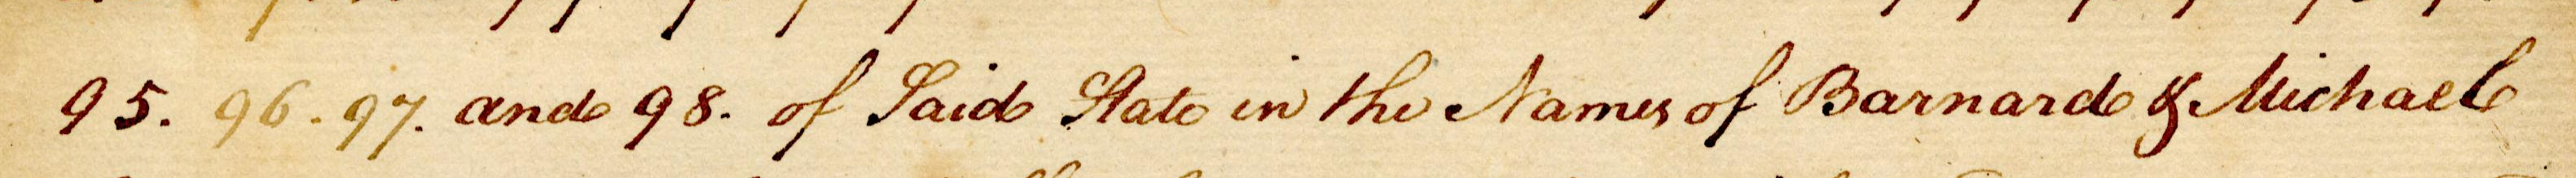95. 96. 97. and 98. of said state in the names of Barnard & Michael
